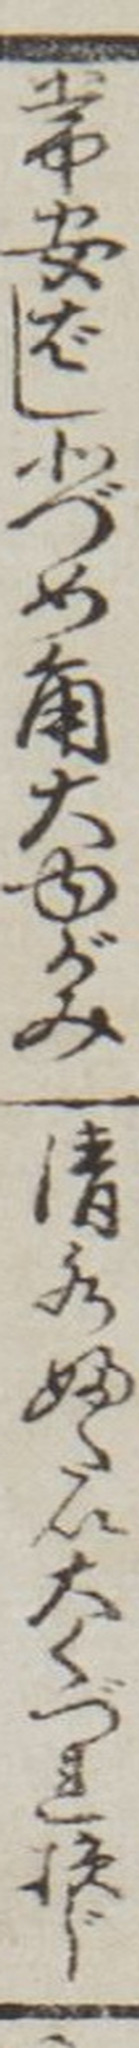常安ばし北づめ角大ゆがみ
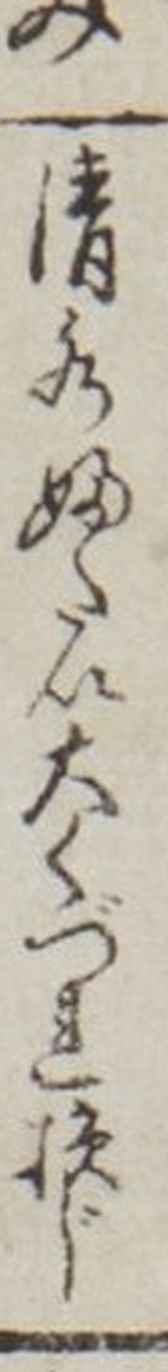清水ふたい大くづれ損じ
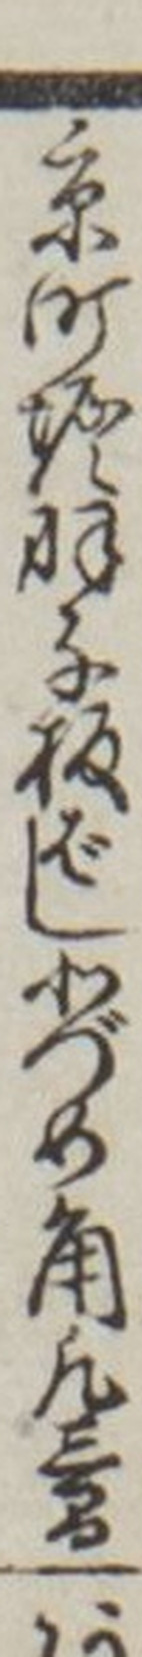京町堀羽子板ばし北づめ角凡三間
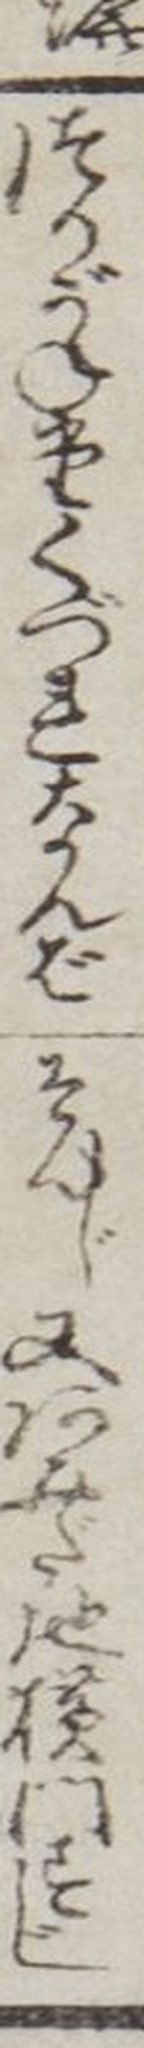つりがね堂くづれなんば
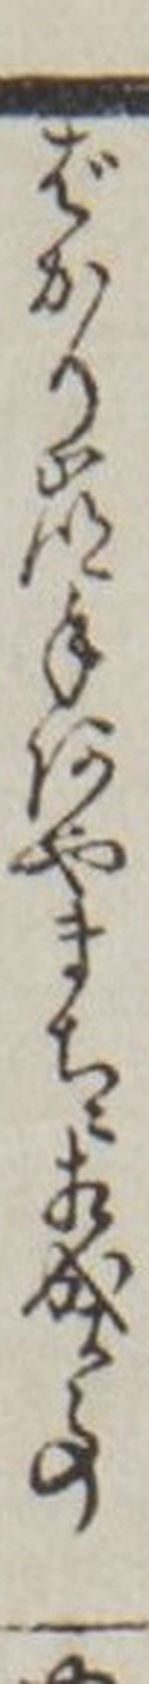ばかり崩手あやまちに相成候事
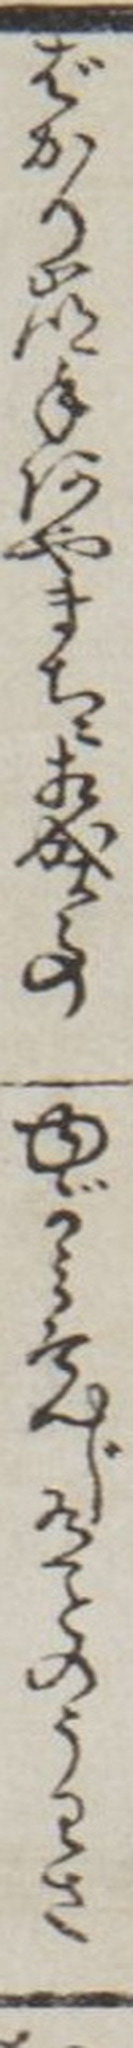ばかり崩手あやまちに相成候事
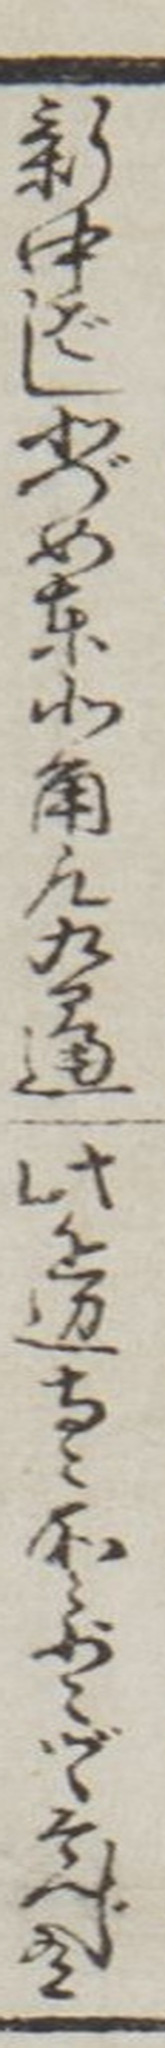新中ばし北づめ東北角凡九部通
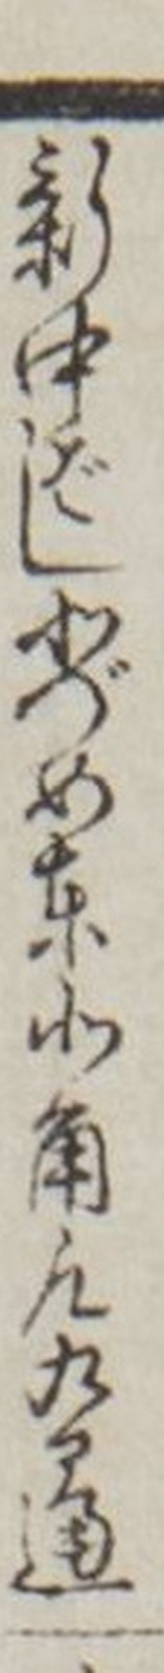新中ばし北づめ東北角凡九部通
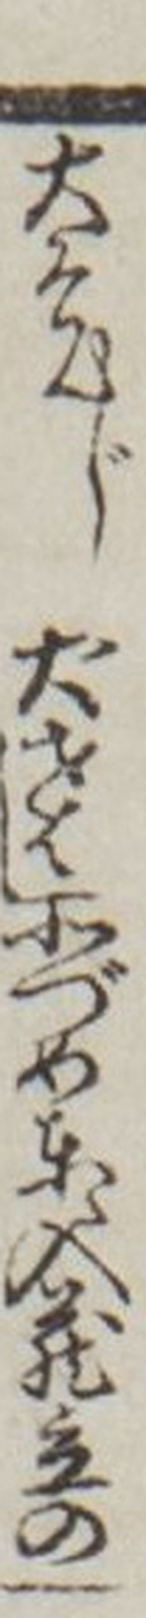大そんじ犬才はし北づめ東へ入蔵立の
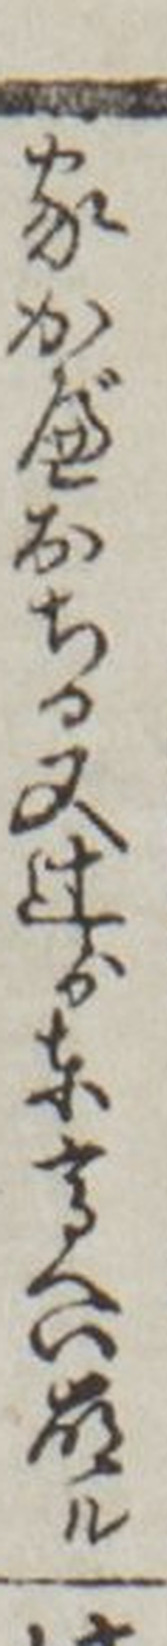家かべおちる又辻より東高へい崩る
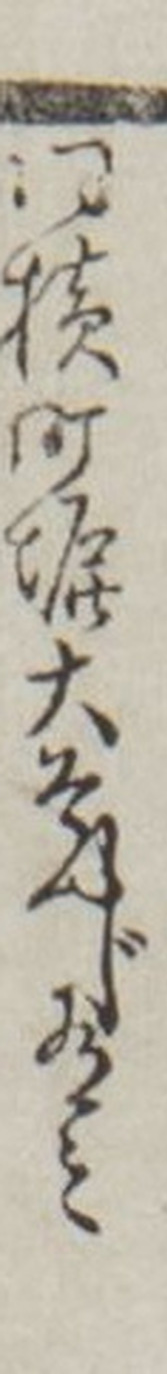同横町塀大そんじ有之
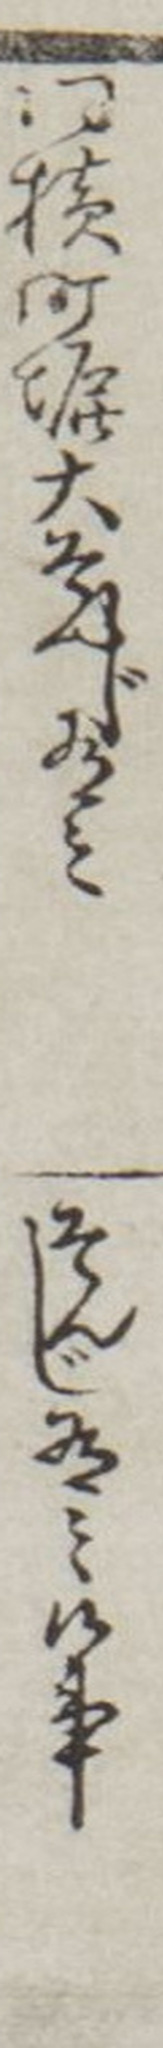同横町塀大そんじ有之
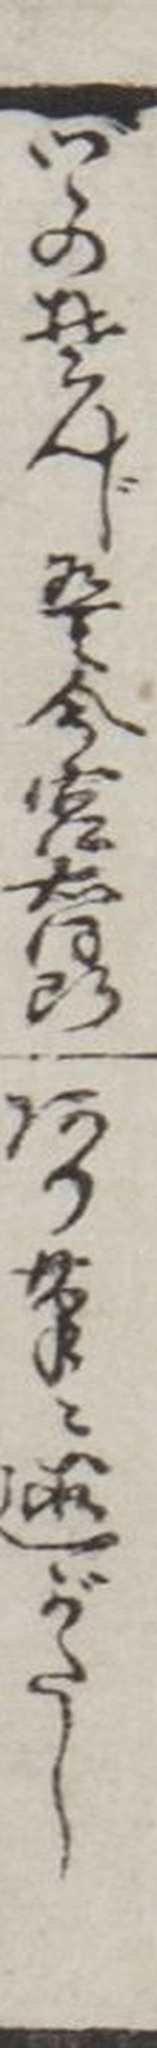づつのそんじ有之今宮右同断
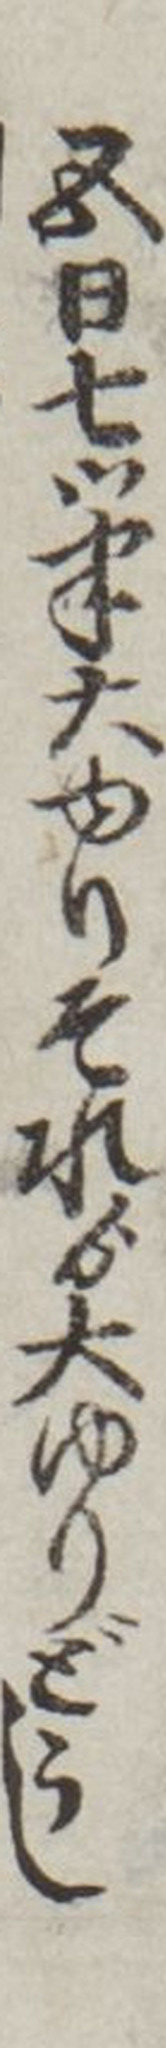五日七ツ半ゆりそれより大ゆりどうし
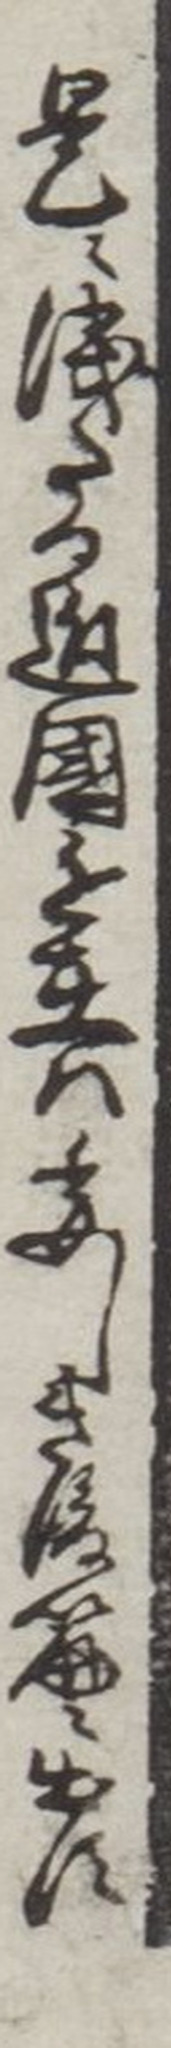是に洩たる近国近在は委しき後篇に出す
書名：本しらべ大阪大地震の次第初編
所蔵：あいおいニッセイ同和損保株式会社
